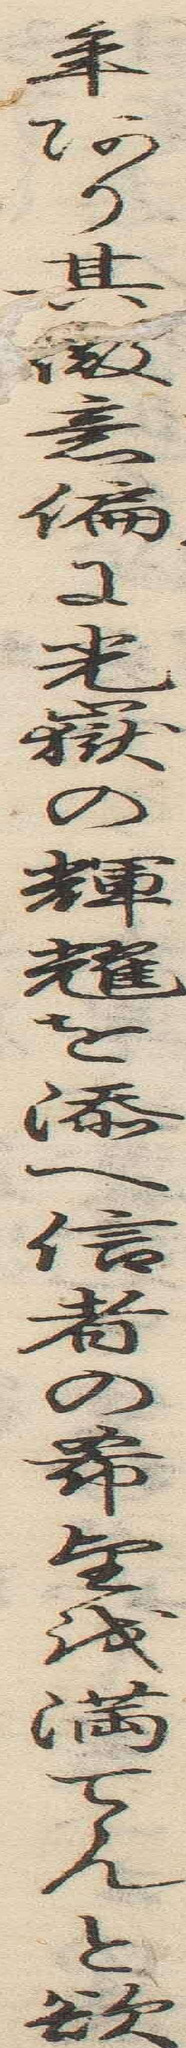年あり其微意偏に光嶽の輝耀を添へ信者の希望を満てんと欲
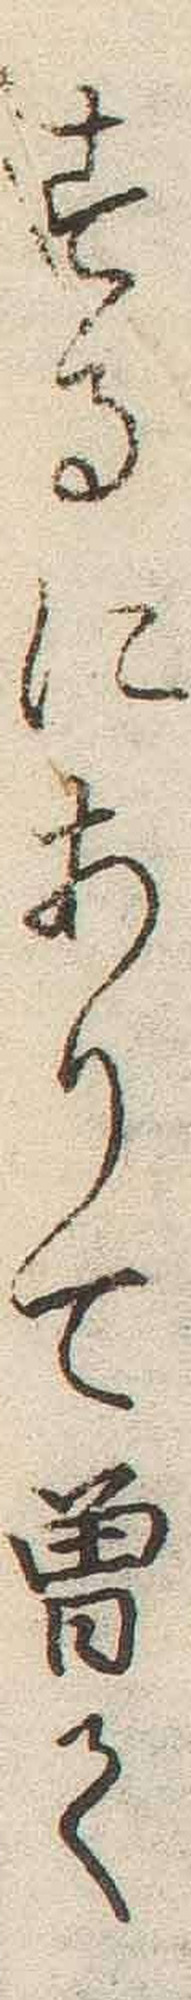するにありて曽て
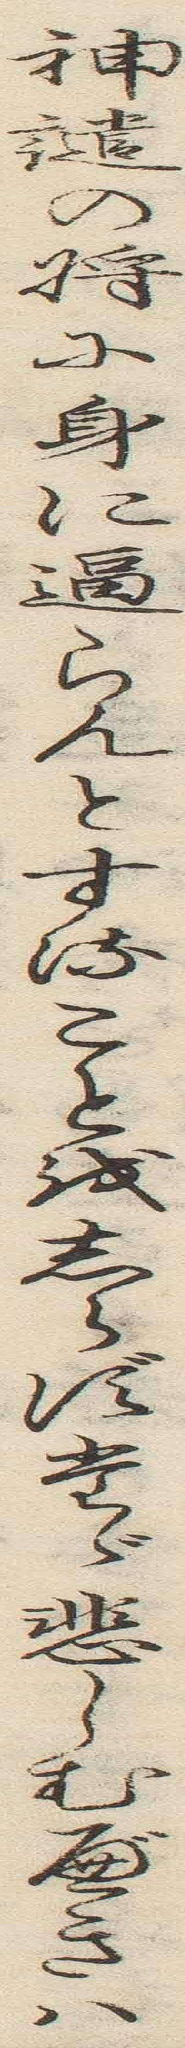神譴の将に身に逼らんとすることをしらずたゞ悲しむべきは
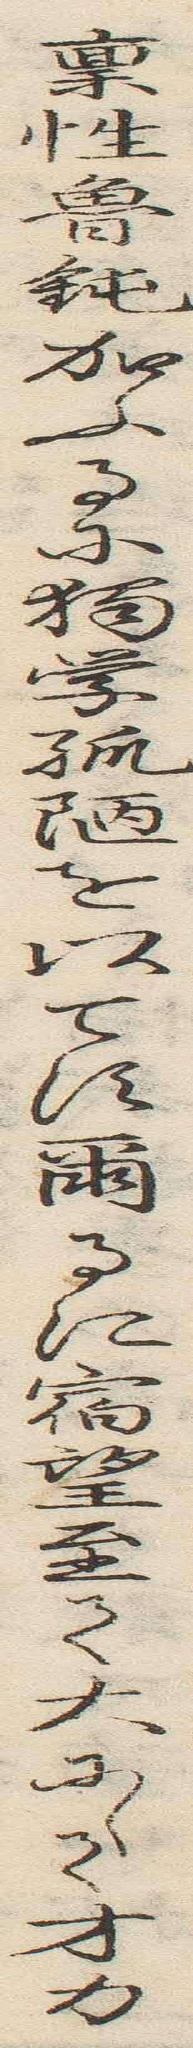稟性魯鈍加ふるに獨学孤陋を以てす爾るに宿望至て大にして才力
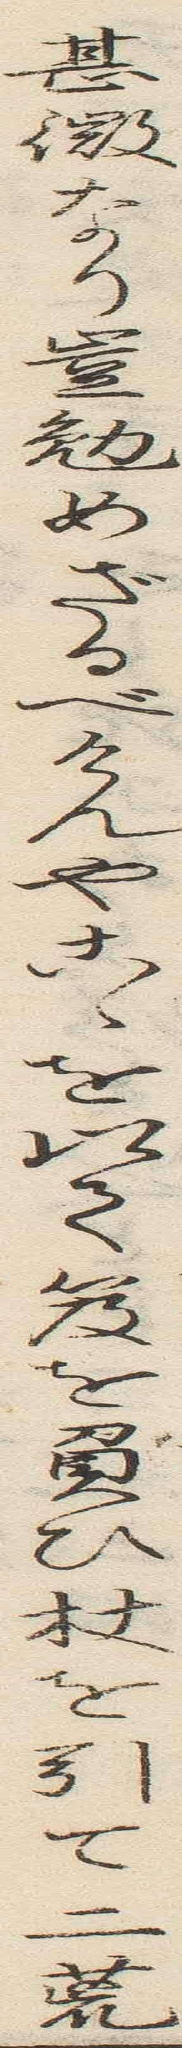甚微なり豈勉めざるべけんやこゝを以て笈を負ひ杖を引て二荒
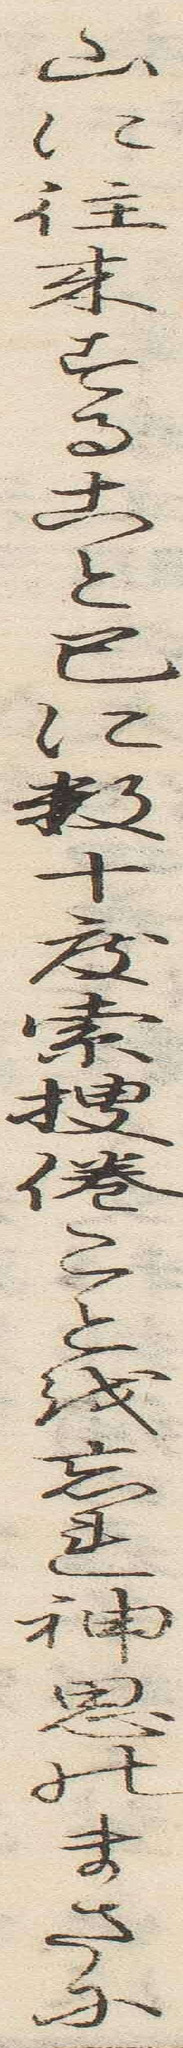山に往来すること已に数十度索搜倦ことを忘れ神思のまさに
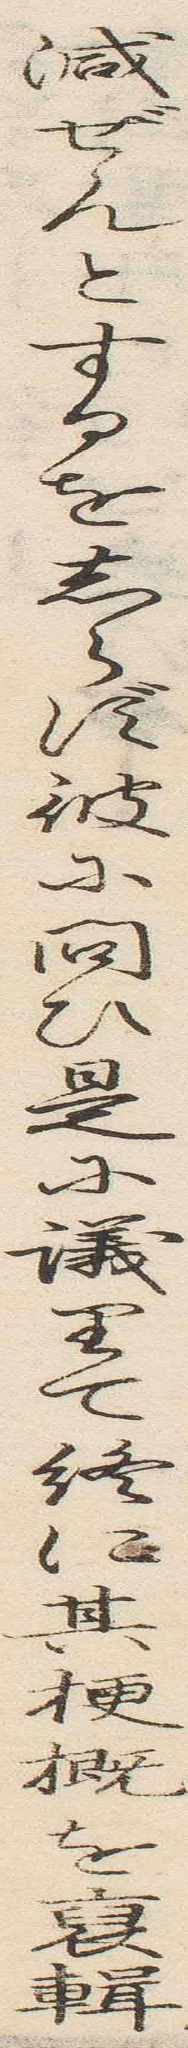減ぜんとするをしらず彼に問ひ是に議りて終に其梗概を裒輯
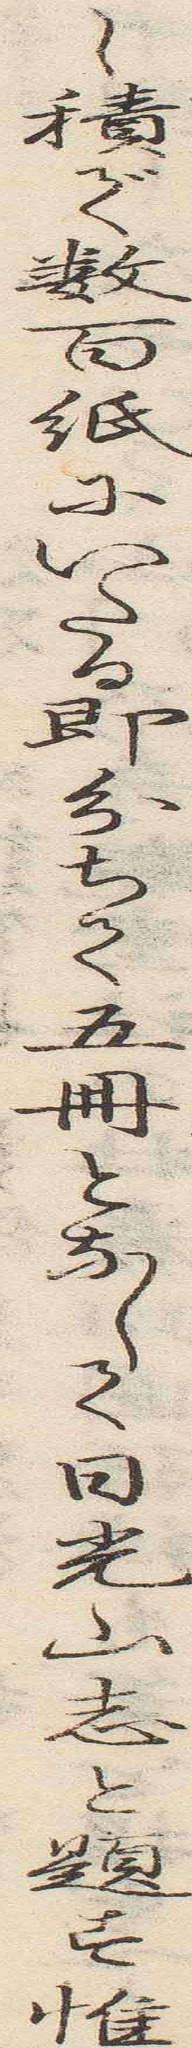し積で数百紙にいたる即分ちて五冊となして日光山志と題す惟
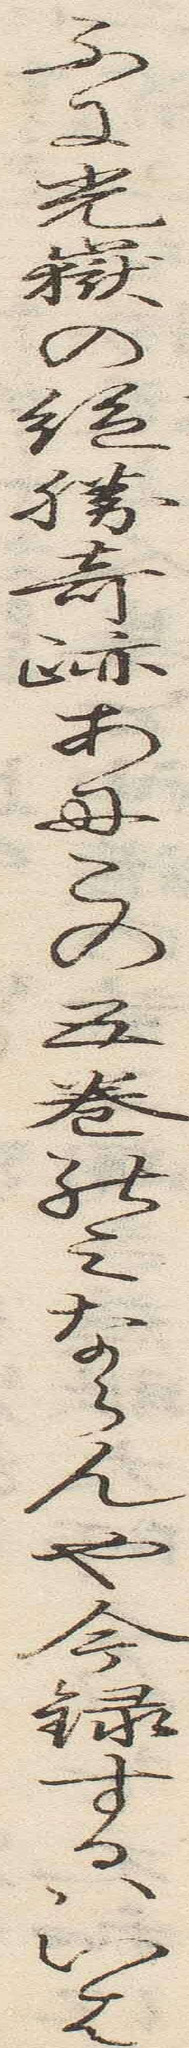ふに光嶽の絶勝竒跡あにこの五巻のみならんや今録するはいは
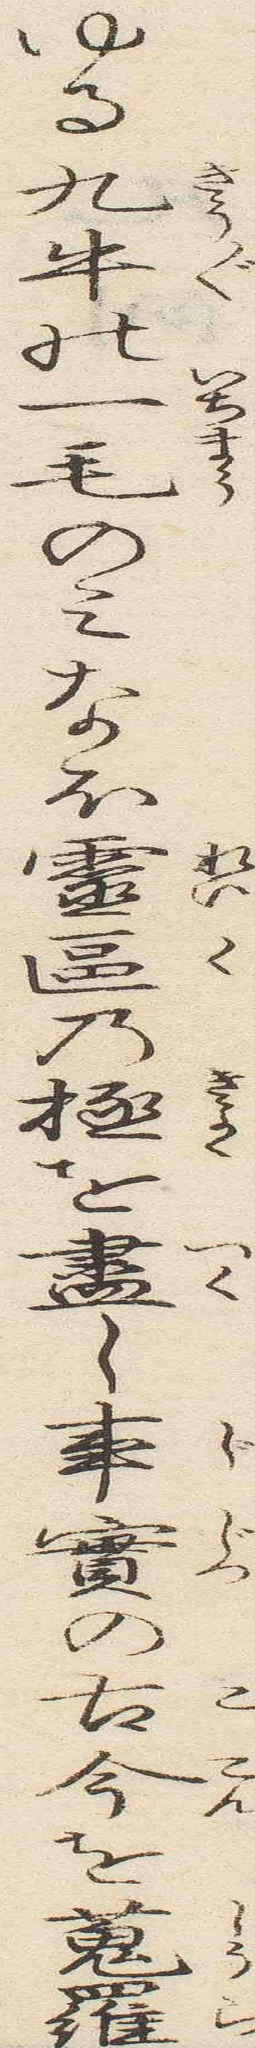ゆる九牛の一毛のみなほ靈區の極を盡し事實の古今を蒐羅
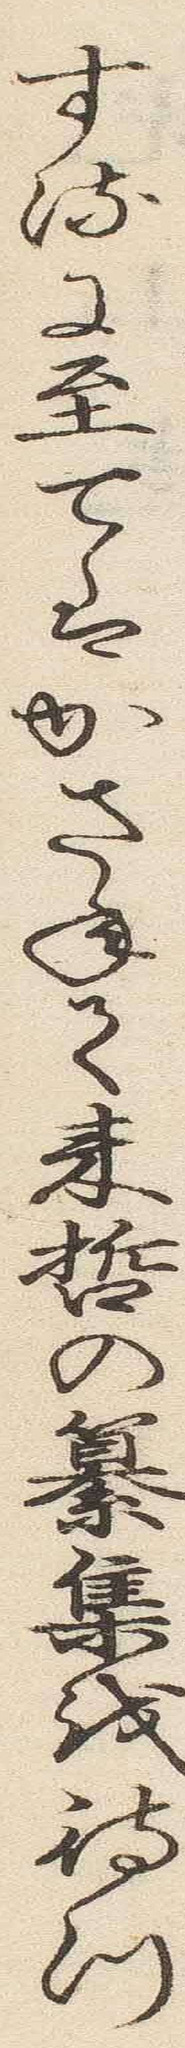するに至てはかさねて来哲の纂集を待つ
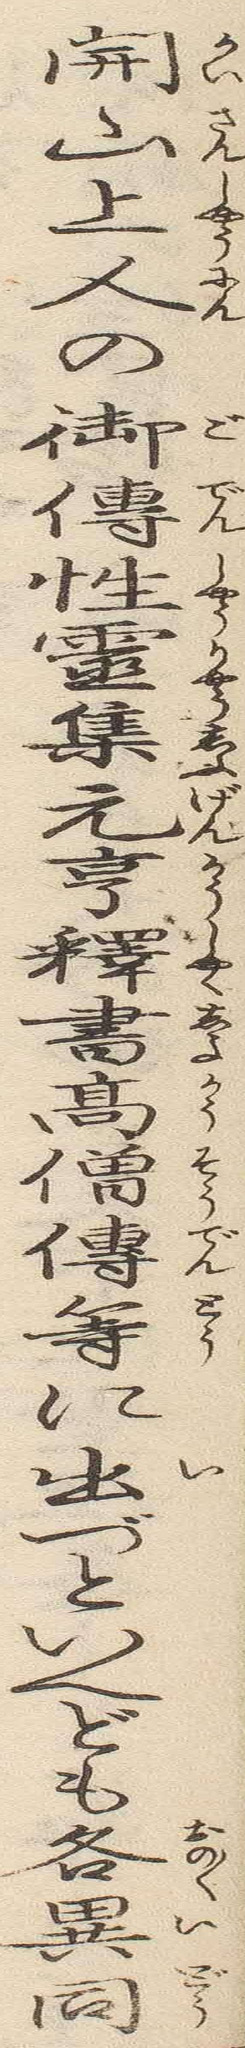一開山上人の御傳性靈集元亨釋書高僧傳等に出づといへども各異同
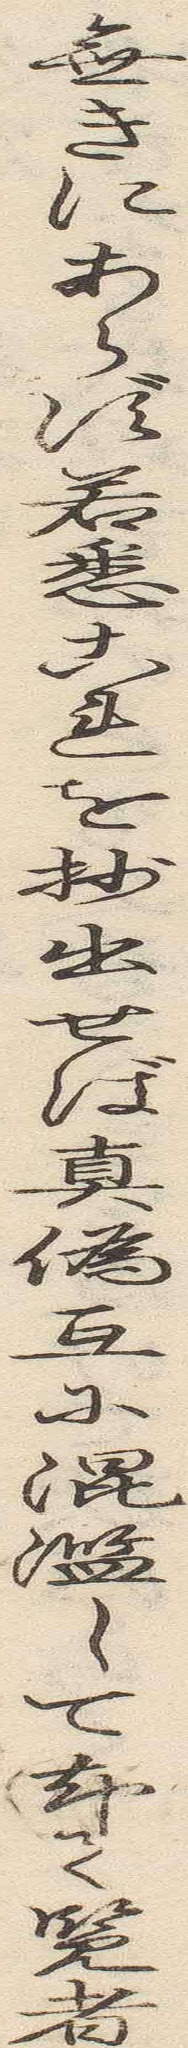無きにあらず若悉これを抄出せば真偽互に混濫して却て覧者
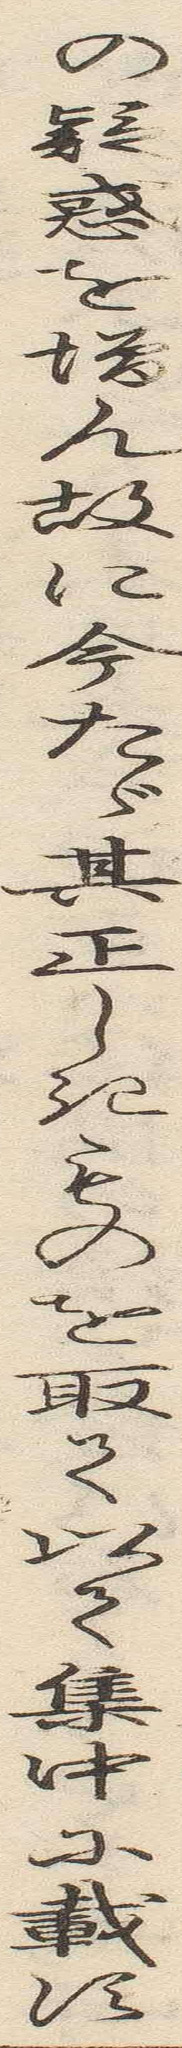の疑惑を増ん故に今たゞ其正しきものを取て以て集中に載す
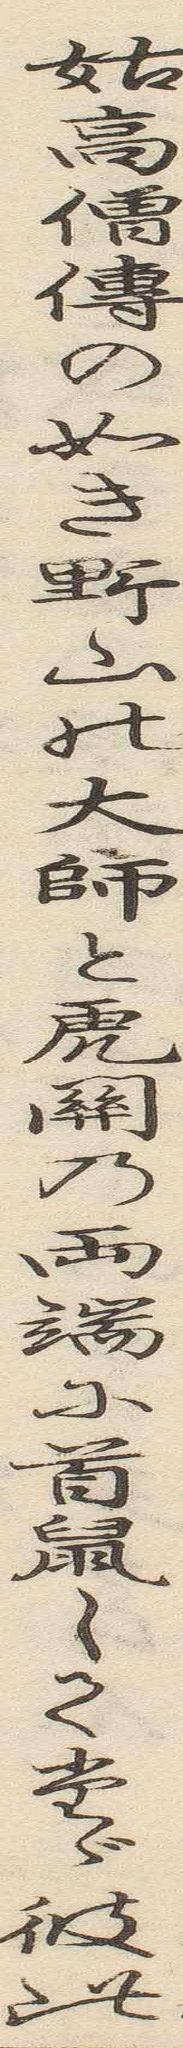姑高僧傳の如き野山の大師と虎關の両端に首鼠してたゞ彼此
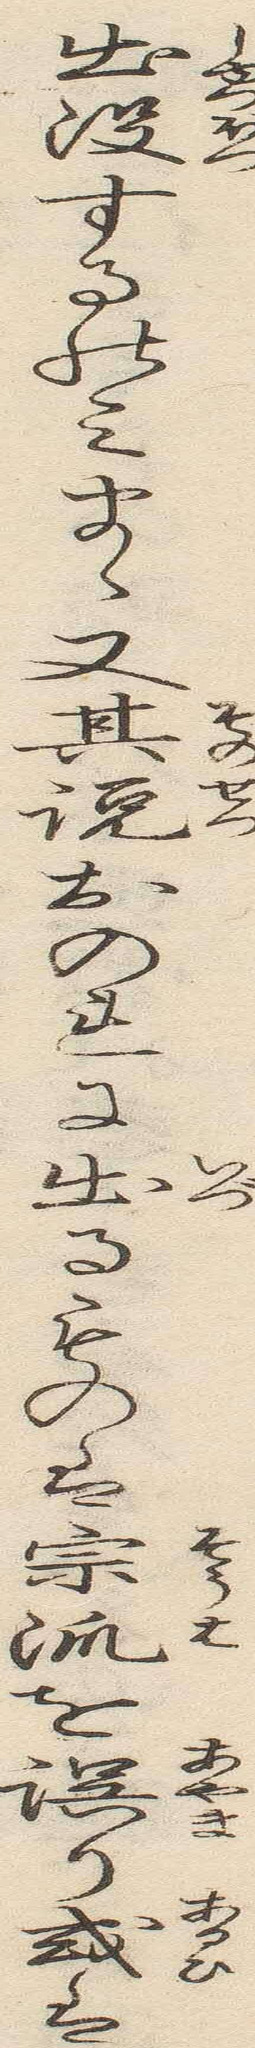出没するのみまゝ又其説おのれに出るものは宗派を誤り或は
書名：日光山志
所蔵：東京学芸大学附属図書館 国文学研究資料館
